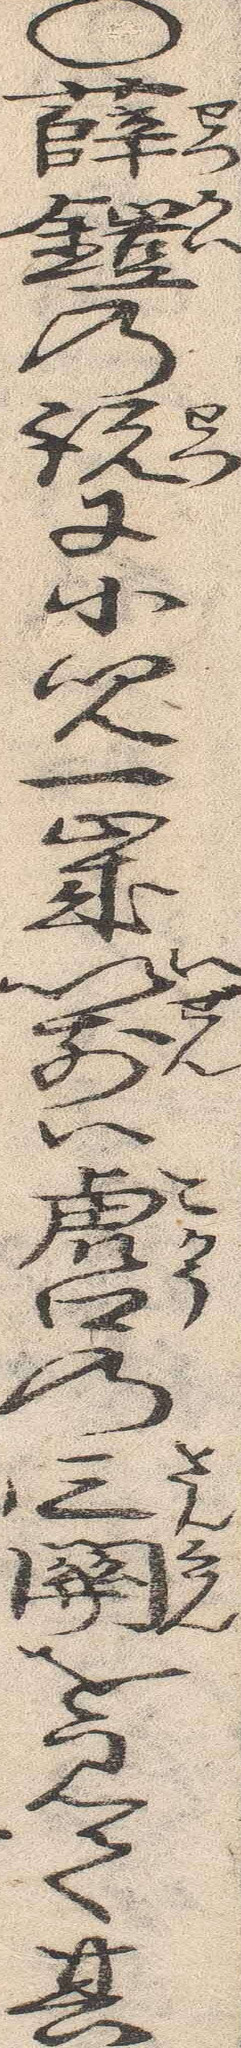◯薛鎧の説に小児一歳以前は虎口の三關を見て其
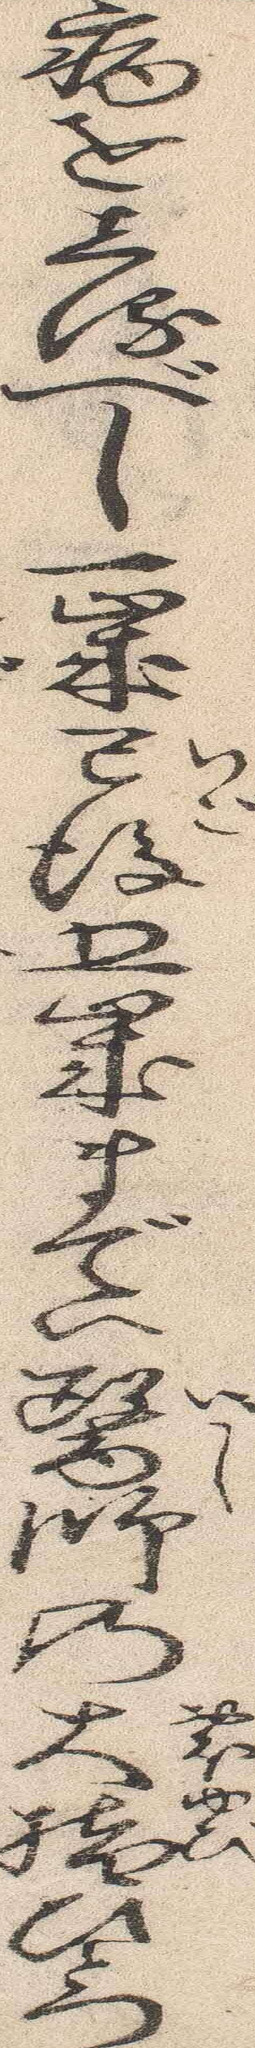病をみるべし一歳已後五歳までは医師の大指ひとつ
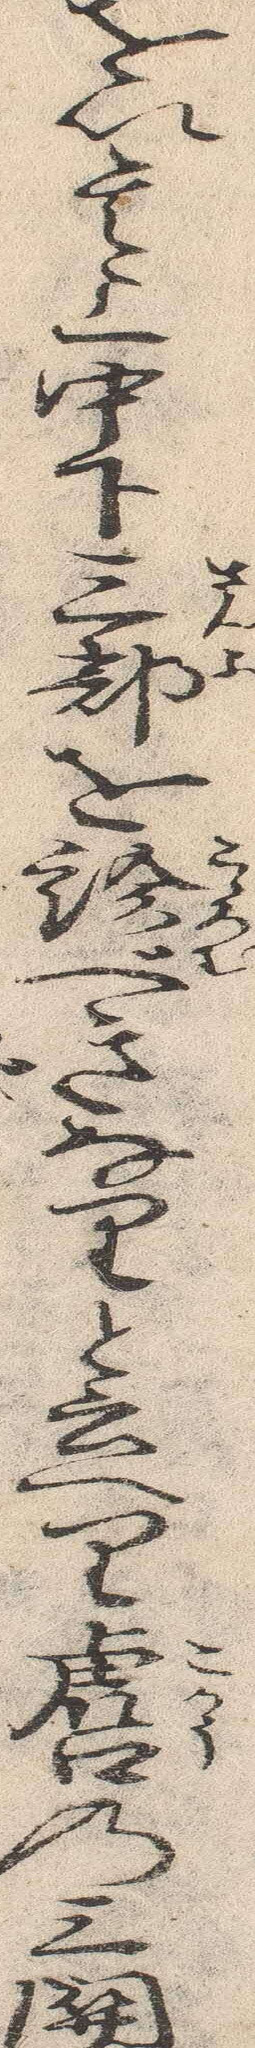を以其上中下三部を診べきなりと云へり虎口の三關
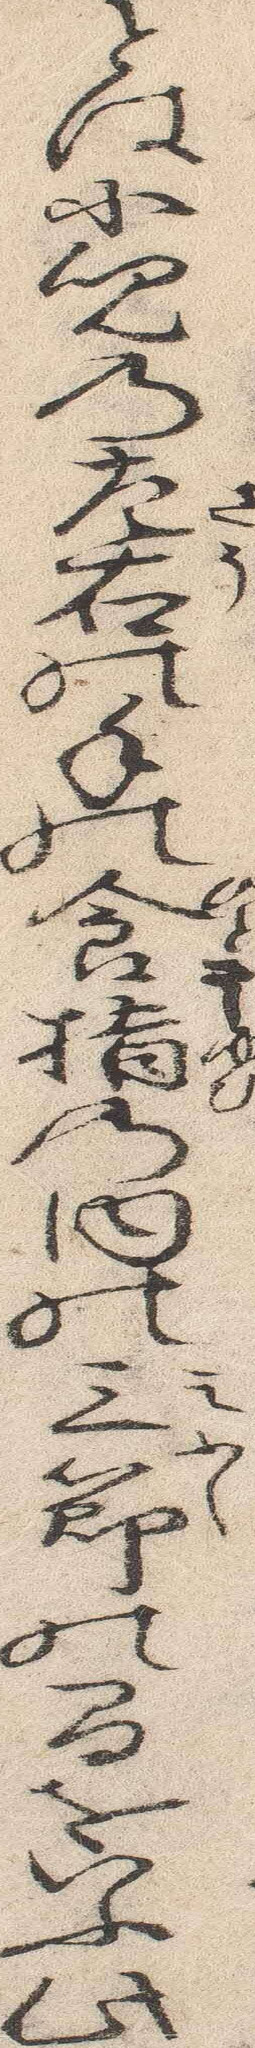とは小児の左右の手の食指の内の三節の間をいふ此
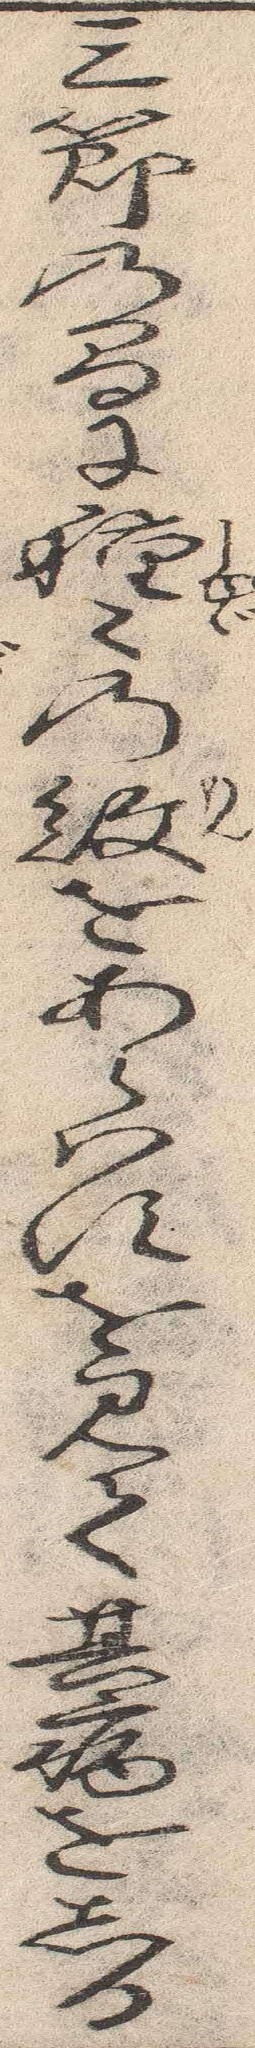三節の間に種〻の紋をあらはすを見て其病をしる
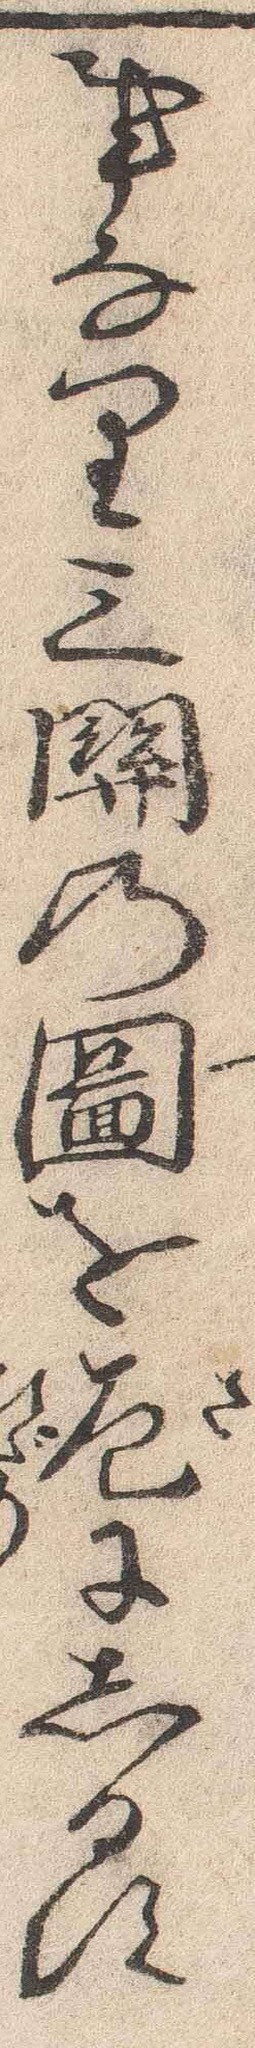事なり三關の圖を㔫にしるす
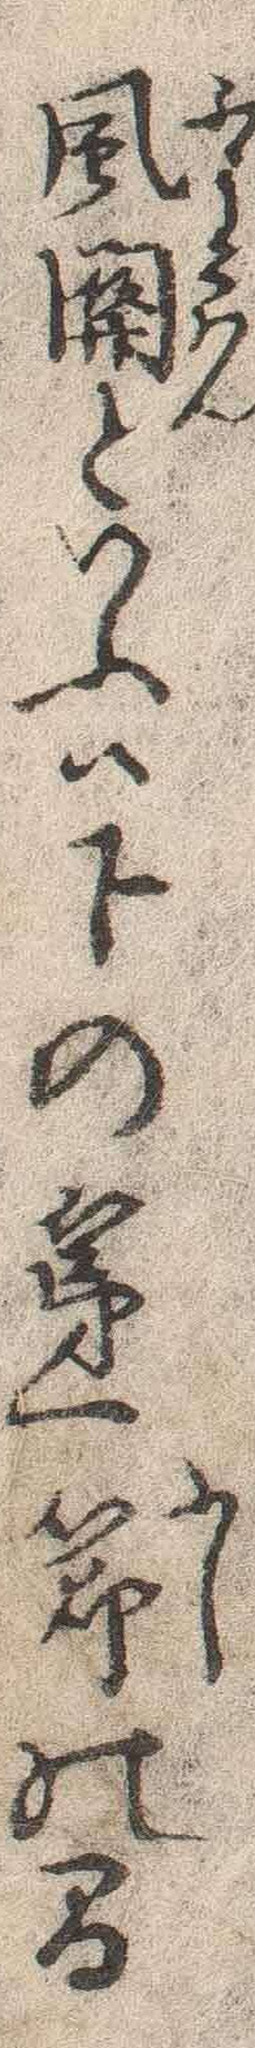風關といふは下の第一節の間
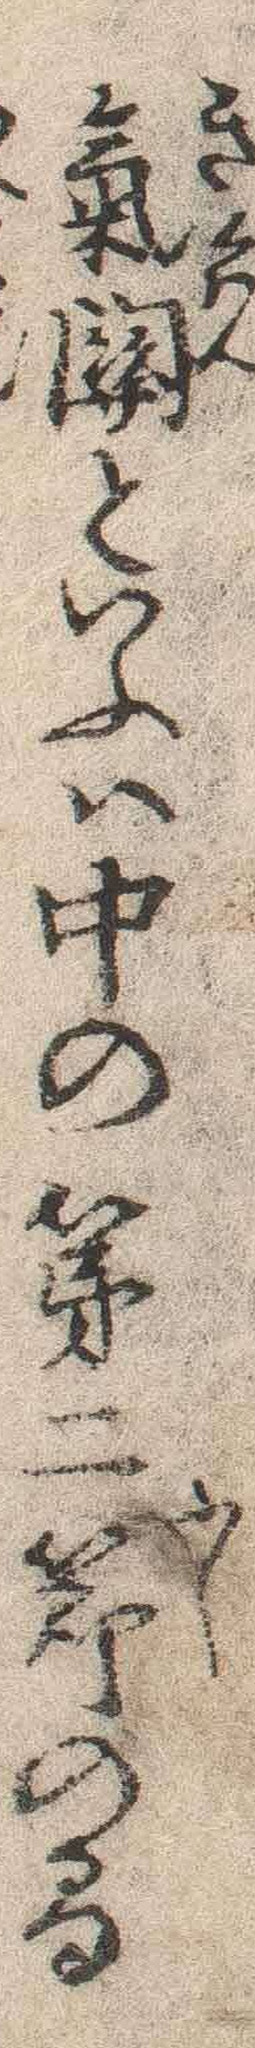氣關といふは中の第二節の間
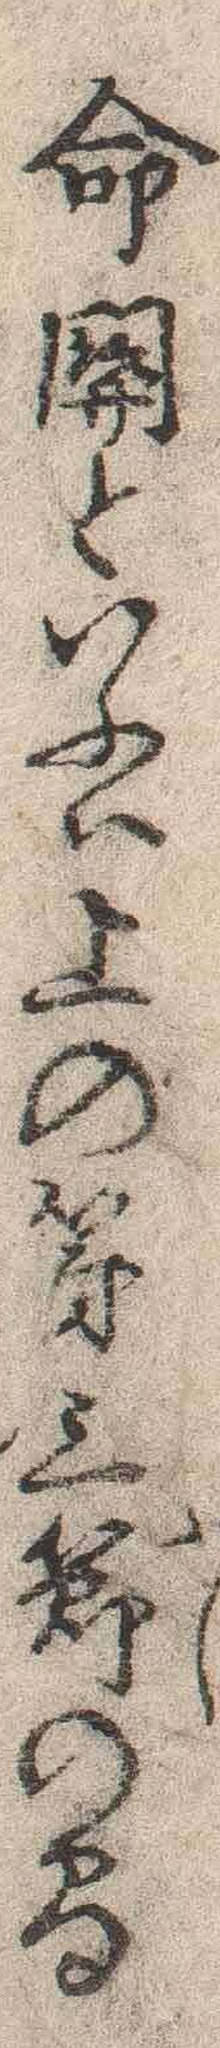命關といふは上の第三節の間
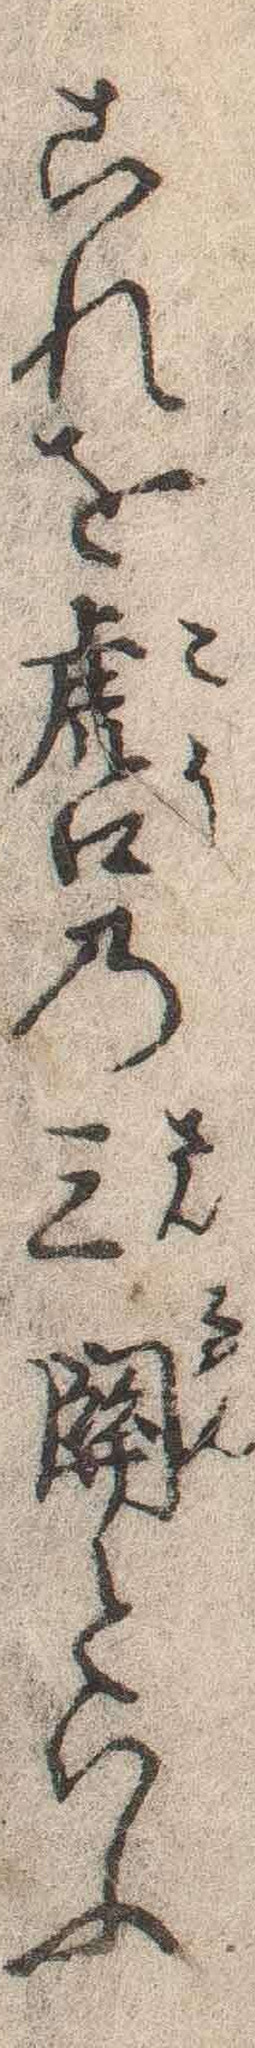これを虎口の三關といふ

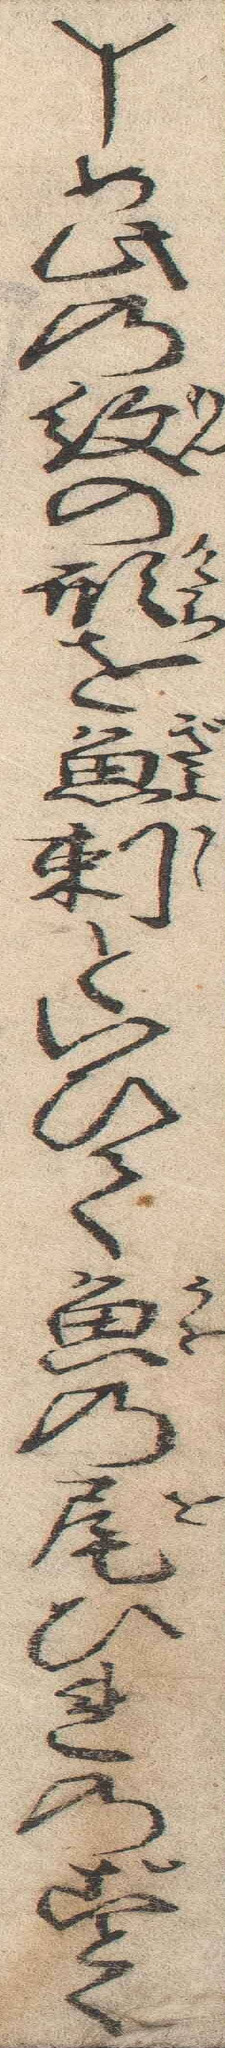如此紋の形を魚刺といひて魚の尾ひれのごとく
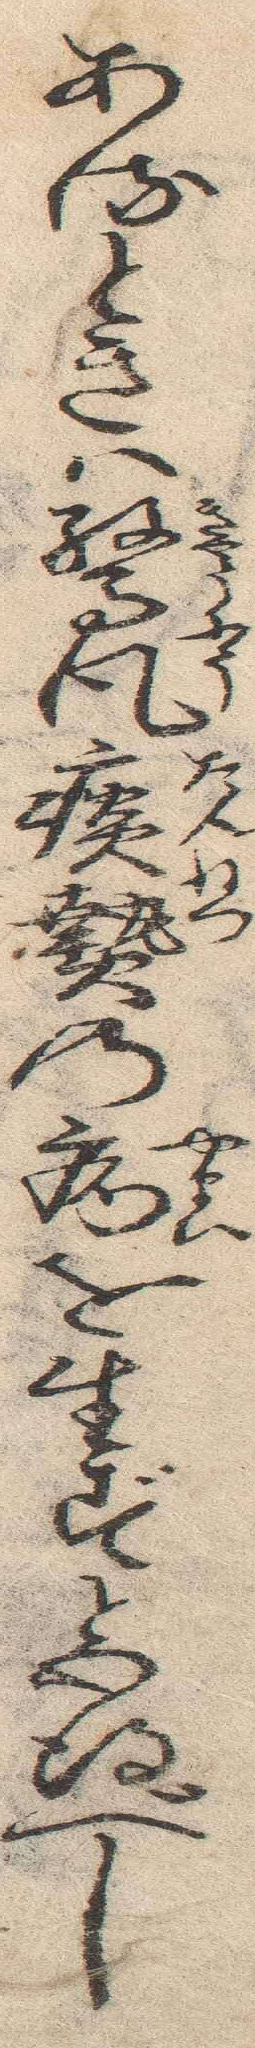あるときは驚風痰𤍽の病を生ずと心得べし
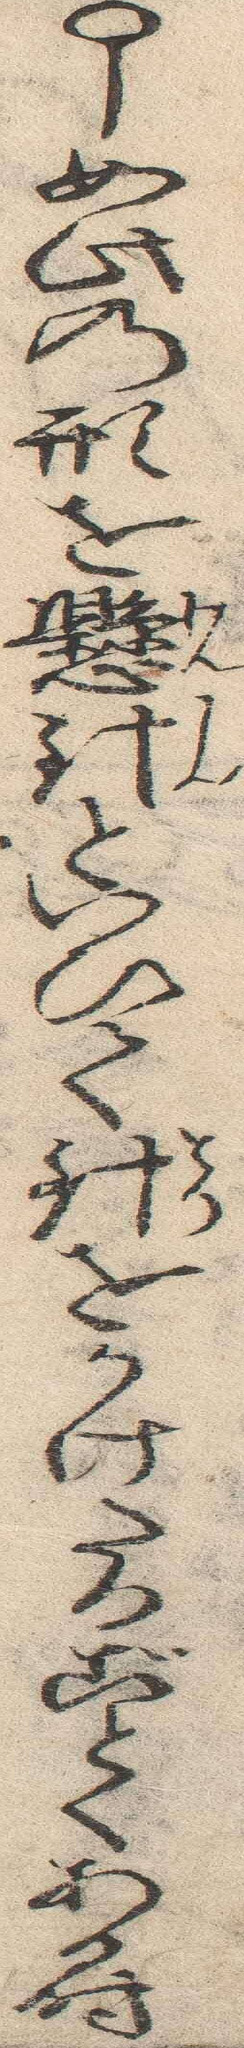如此の形を懸針といひて針をかけたるごとくある時
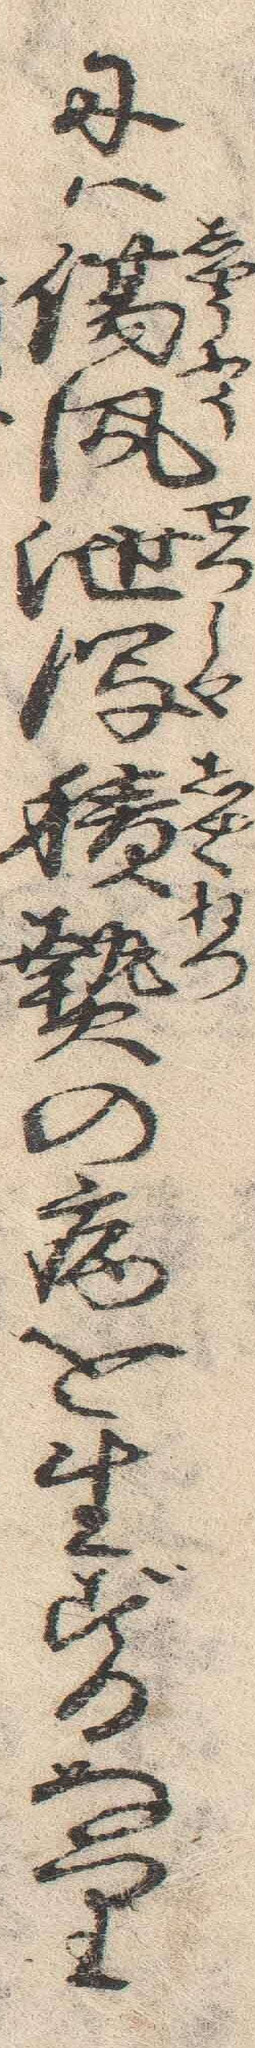には傷風泄泻積𤍽の病を生ずるなり
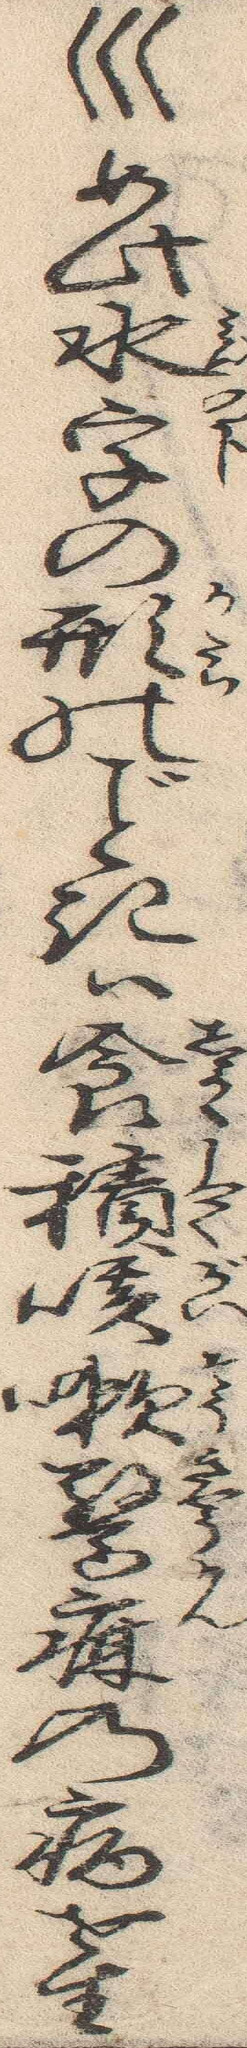如此水字の形のごときは食積咳嗽驚疳の病を生
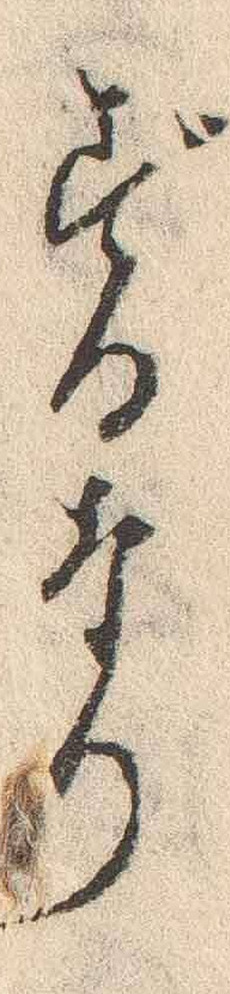ずるなり
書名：小児必用養育草
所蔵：東京学芸大学附属図書館 国文学研究資料館
